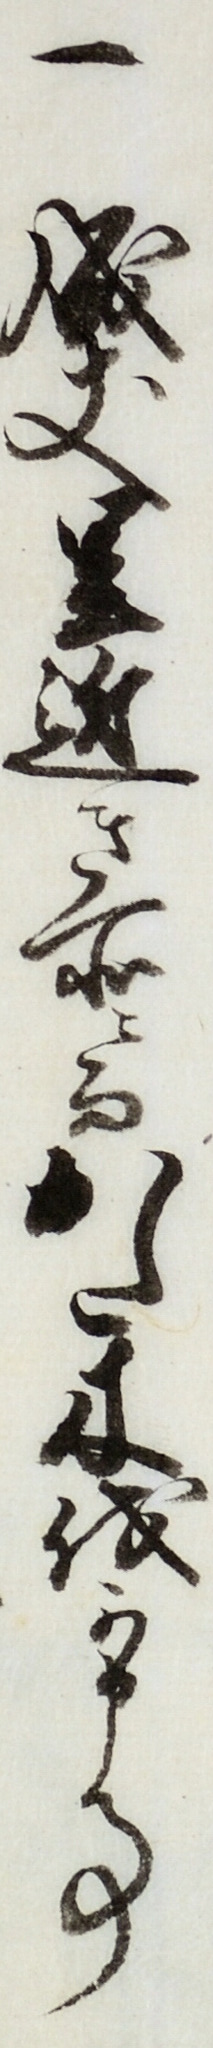一成丈里近き所ニ而かた木伐可申事
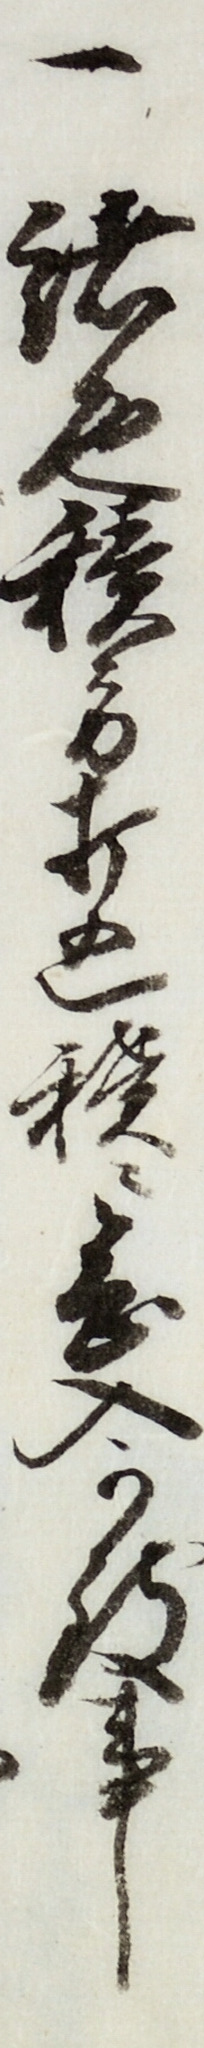一諸色積方打込積ニ念入可致事
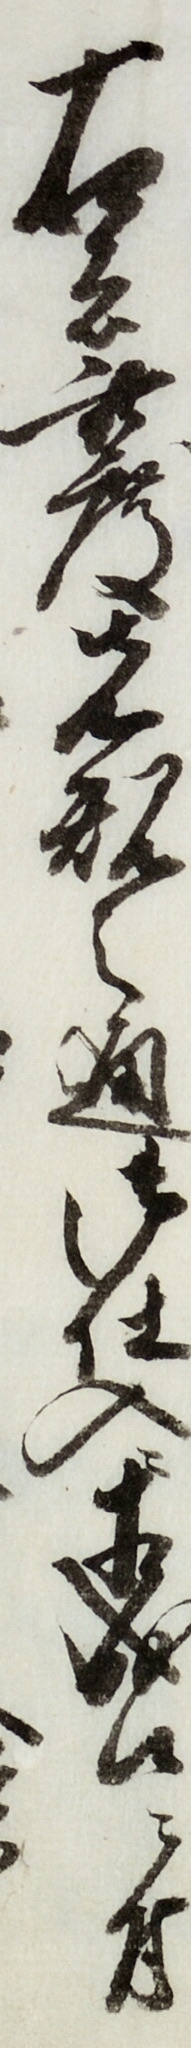右者此度先規之通御仕入ニ相成候ニ付
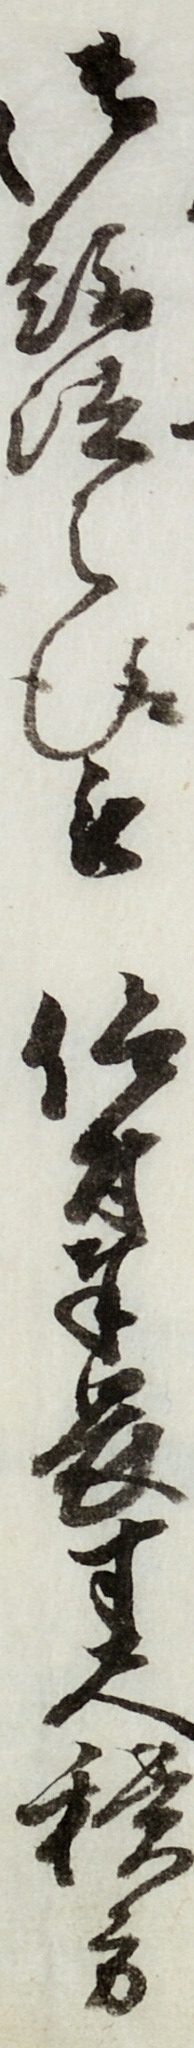御趣法之趣仰付奉畏寸尺積方
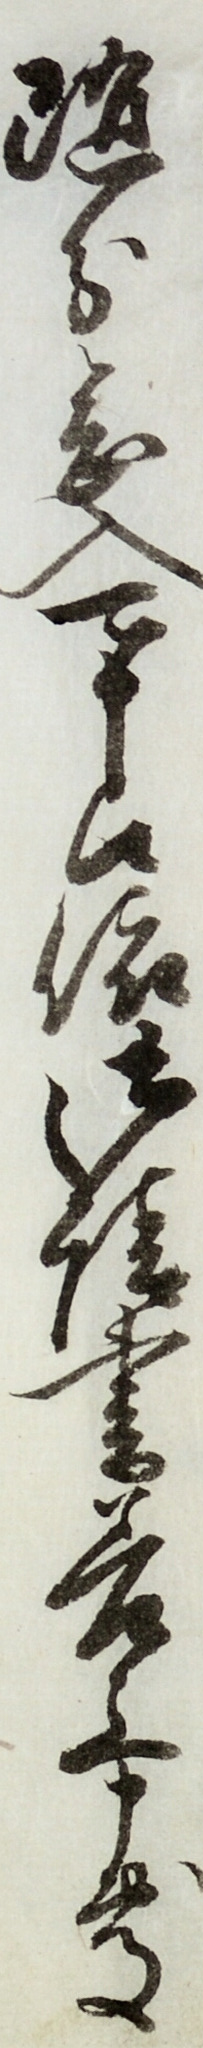随分念入可申候依御請書差上申処

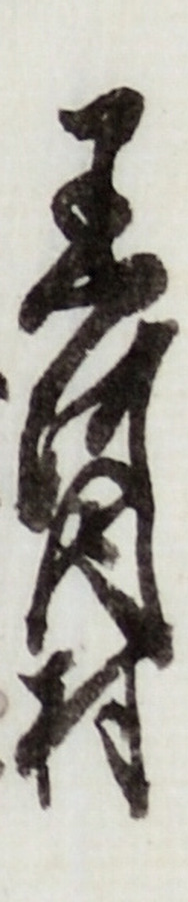王河内村
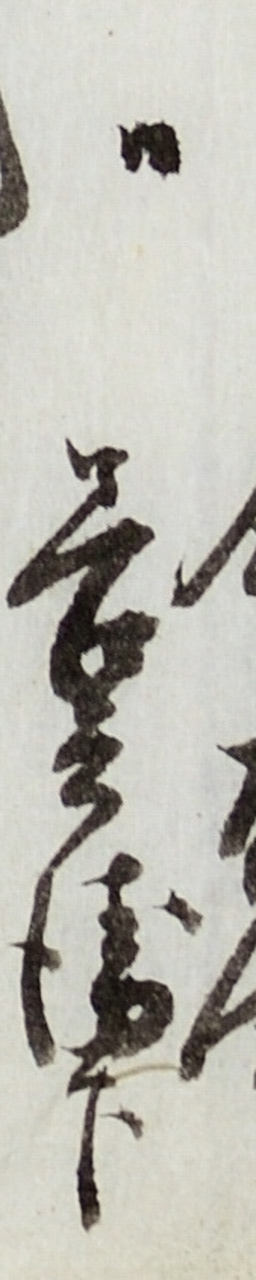同善兵衛印
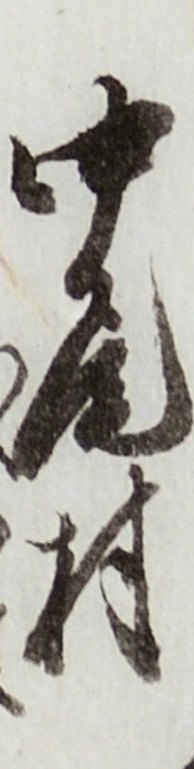中尾村
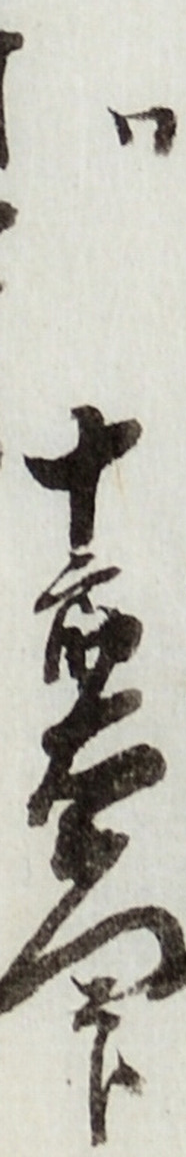同十郎右衛門印
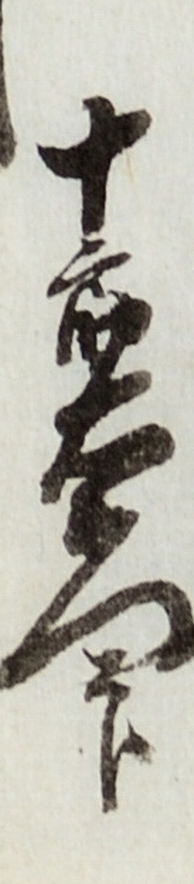同十郎右衛門印
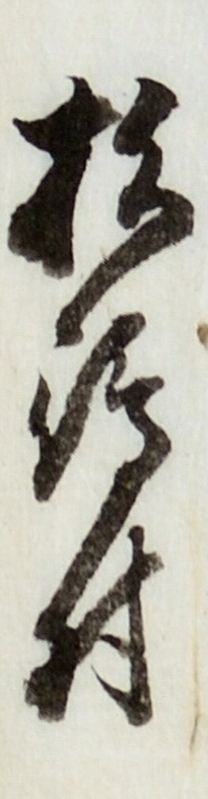杉嶋村
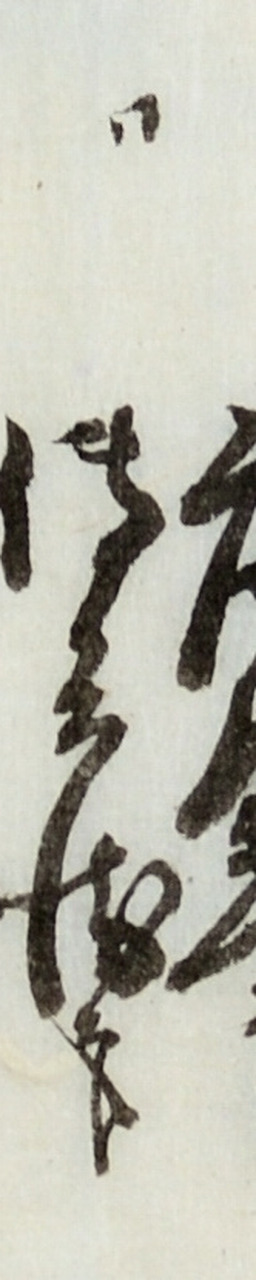同伝兵衛印
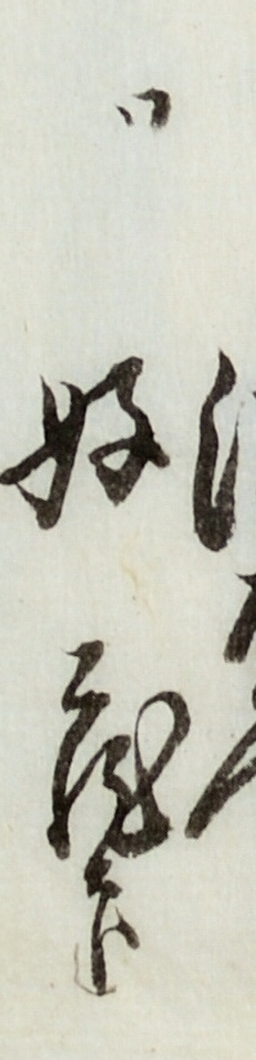同好蔵印
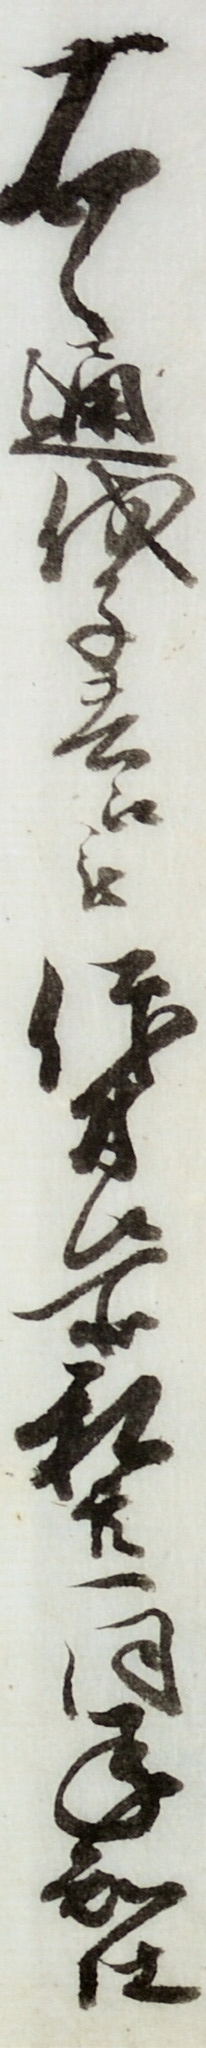右之通伐子春江被仰付候所私共一同承知仕
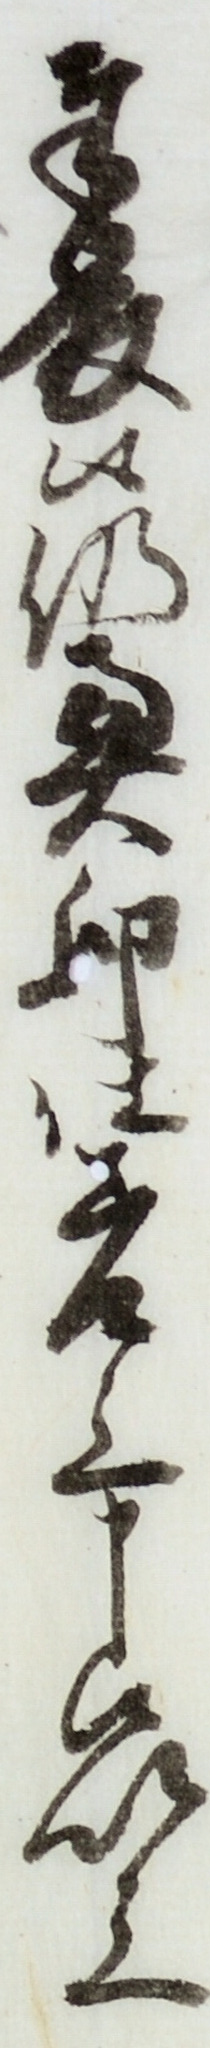奉畏候仍奥印仕差上申候以上

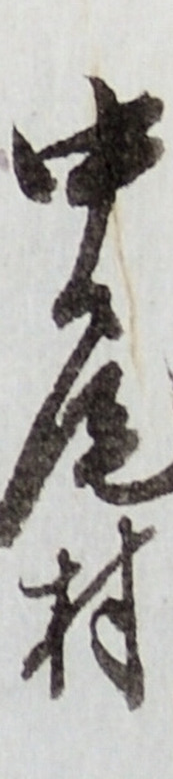中尾村
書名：御薪方掟控
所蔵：伊那市立高遠町図書館・合同会社AMANE
